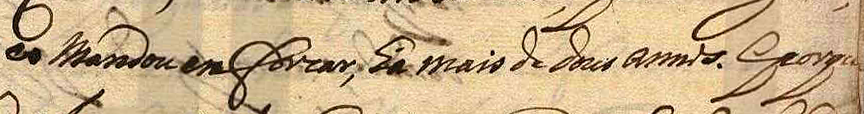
e o mandou enforcar, há mais de dous annos. E porque
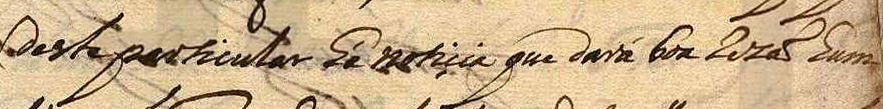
deste particular hé notiçia que dará boa Rezaõ hum
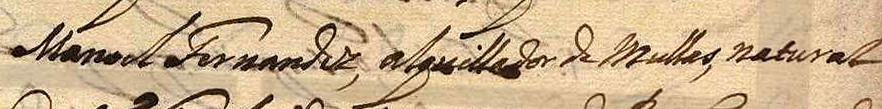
Manoel Fernandez, alquillador de mullas, natural
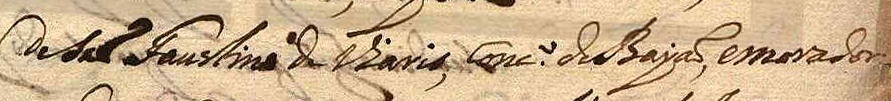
de Saõ Faustino de Viaris, conco. de Bayaõ, e morador
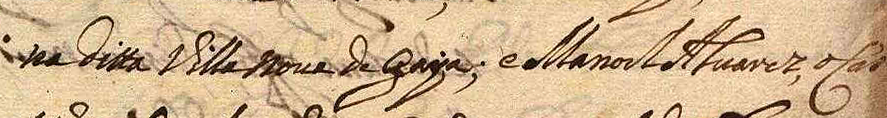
na ditta Villa noua de gaya; e Manoel Aluarez, o Cas
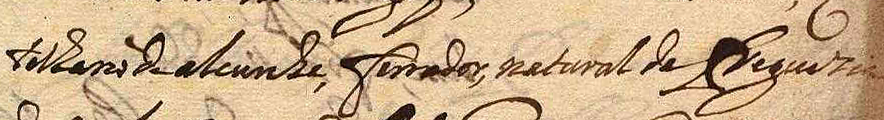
telhano de alcunha, ferrador, natural da freguezia
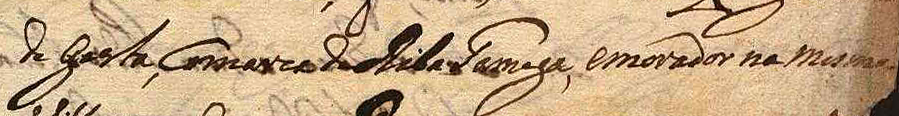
de gesta, Comarca de Riba Tamega, e morador na mesma
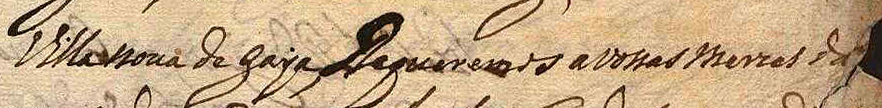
Villa noua de Gaya, Requeremos a vossas merces da
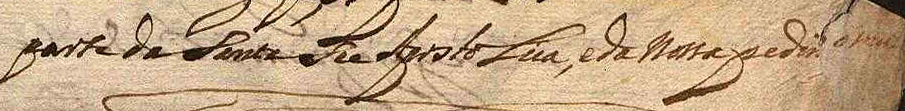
parte da santa see ApostoLica, e da nossa pedin
